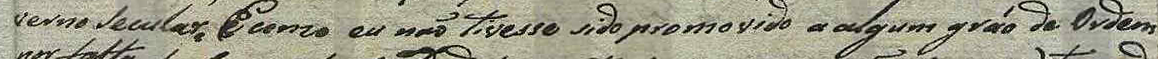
verno secular. E como eu naõ tivesse sido promovido a algum gráo da Ordem
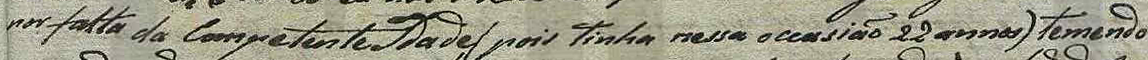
por falta da Competente Idade, (pois tinha nessa occasiaõ 22 annos) temendo
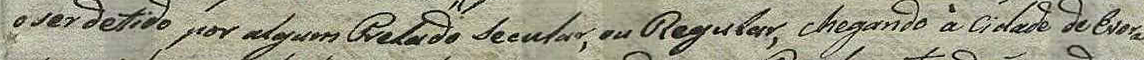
o ser detido por algum Prelado secular, ou Regular, chegando à cidade de Evora
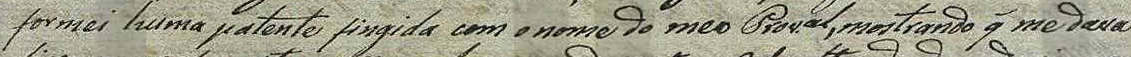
formei huma patente fingida com o nome do meo Prov.al, mostrando q̄ me dava
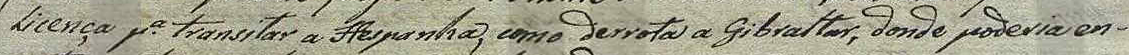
Licença p.a transitar a Hespanha, como derrota a Gibraltar, donde poderia en
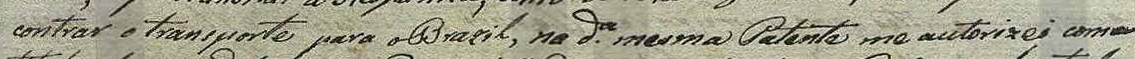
contrar o transporte para o Brazil, na d.a mesma Patente me autorizei com o
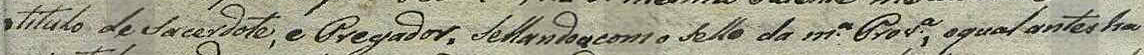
o titulo de sacerdote, e Pregador, sellandoa com o sello da m.a Prov.a, o qual antes ha
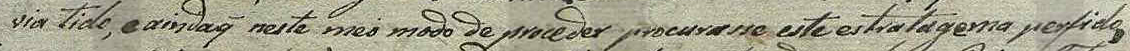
via tido, e ainda q̄ neste meo modo de proceder procurasse este estratagema perfido,
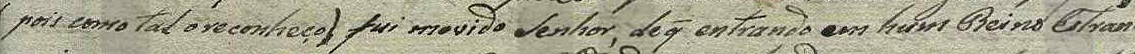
pois como tal o reconheço) fui movido Senhor, de q̄ entrando em hum Reino Estran
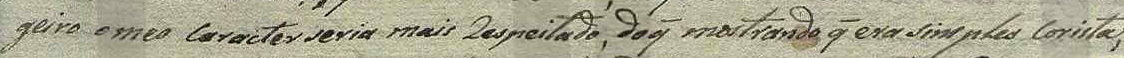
geiro o meo caracter seria mais Respeitado, do q̄ mostrando q̄ era simples corista,
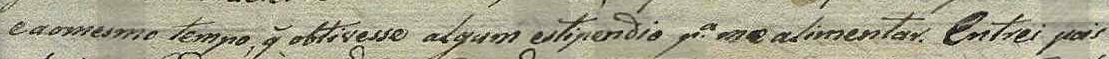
e ao mesmo tempo, q̄ estivesse algum estipendio p.a me alimentar. Entrei pois
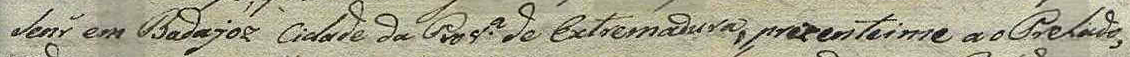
Senr̄ em Badajoz Cidade da Prov.a de Extremadura, prezenteime ao Prelado,
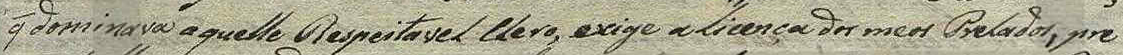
q̄ dominava aquelle Respeitavel Clero, exige a Licença dos meos Prelados, pre
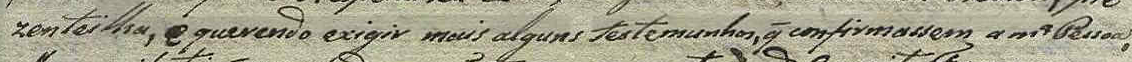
zenteilha, e querendo exigir mais alguns testemunhos, q̄ confirmassem a m.a Pessoa,
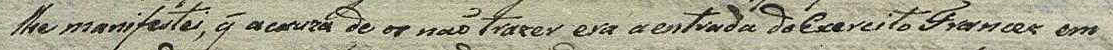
lhe manifestei, q̄ a cauza de os naõ trazer era a entrada do Exercito Francez em
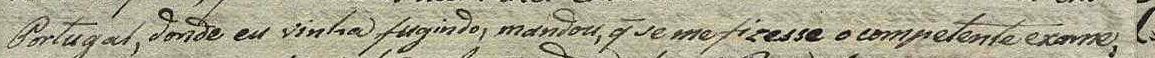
Portugal, donde eu vinha fugindo, mandou, q̄ se me fizesse o competente exame,
